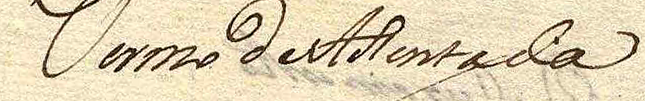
Termo de Assentada
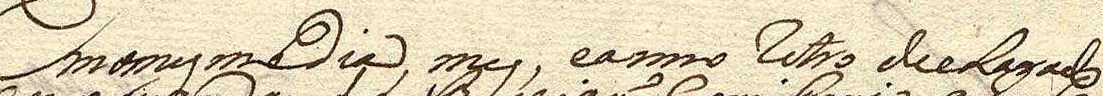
Em o mesmo dia, mes, e anno Retro decLarado
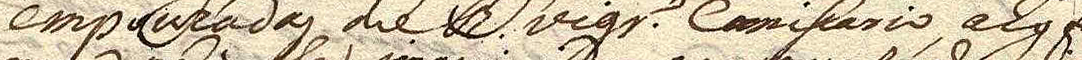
em pouzadas do R. vigr.o Comissario ahy fo
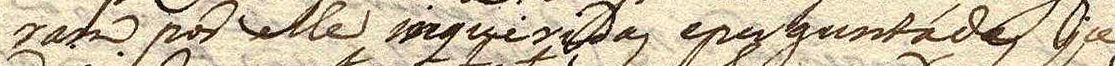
ram por elle inquiridas e perguntadas ju
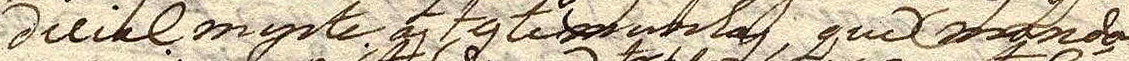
dicialmente as testemuntas, que manda
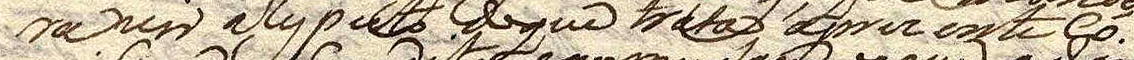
ra uir a Respeito do que trata a prezente Cō
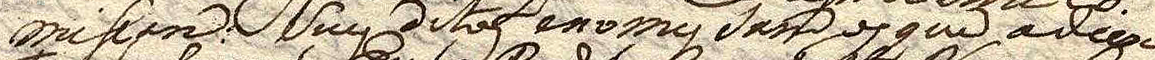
missam: Seus ditos e nomes sam os que adian
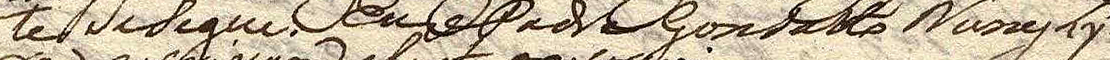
te se Segue. Eu o Padre Gonsallo Nunes Ly
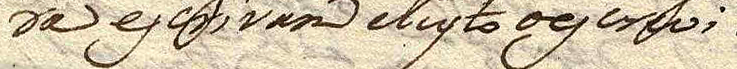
ra escrivam eleyto o escrevi.
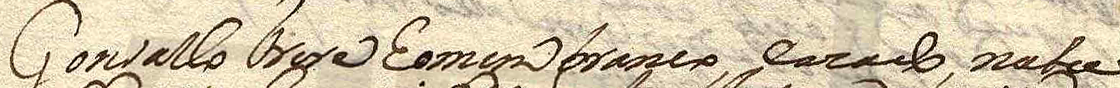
Gonsallo Frere homem branco, cazado natu
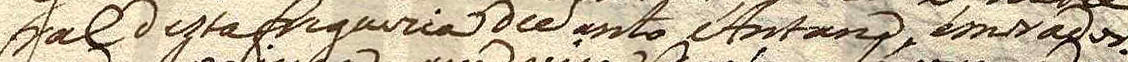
ral desta freguezia de Santo Antan, e morador
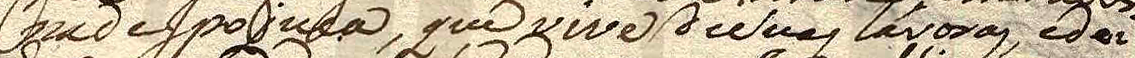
na de Ipojuca, que vive de suas lavoras, e de i
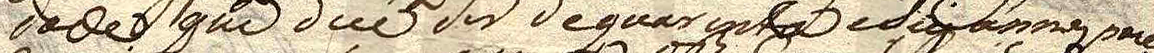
dade que dice sir de quarenta e Seis annos pou
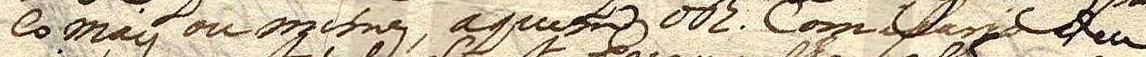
co mais ou menos, a quem o R. Comissario deu
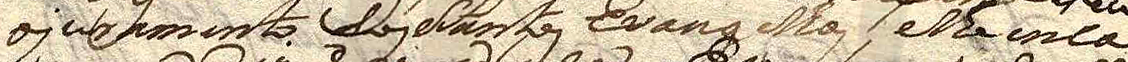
o juramento dos Santos Evangelhos, elhe enca
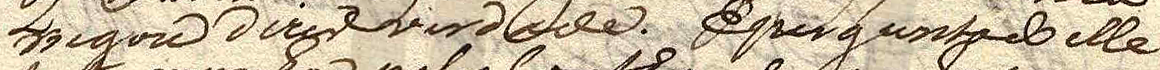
rregou dizer verdade. E perguntado elle
